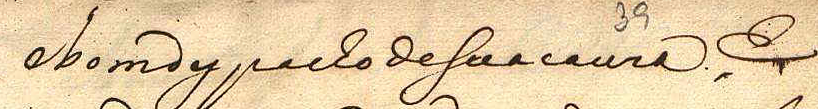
e bom despacho de sua cauza, E
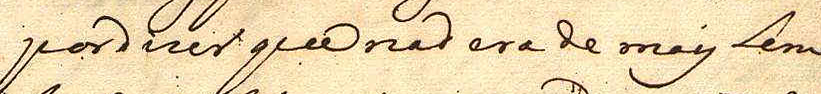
por dizer que naõ era de mais Lem
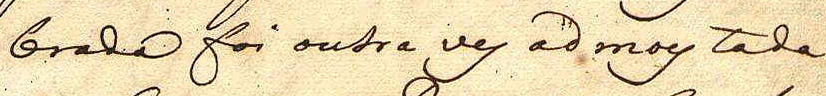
brada foi outra ves admoestada
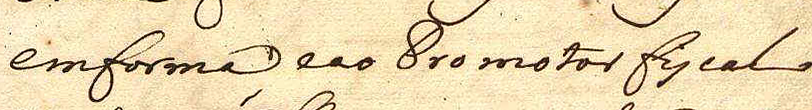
em forma, e ao Promotor fiscal
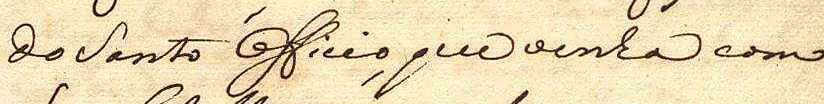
do Santo Officio, que vinha com
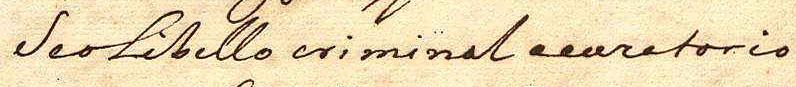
seo Libello criminal acuzatorio
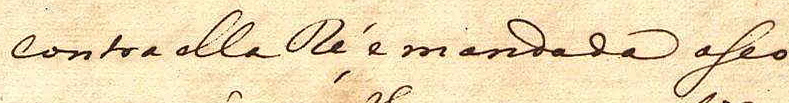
contra ella Ré, e mandada a seo
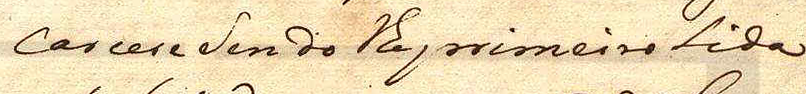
carcere sendo lhe primeiro Lida
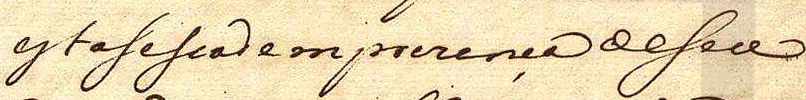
esta sessaõ em prezença de seu
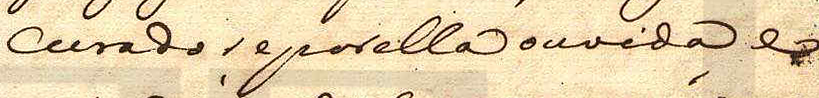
curador e por ella ouvida, e
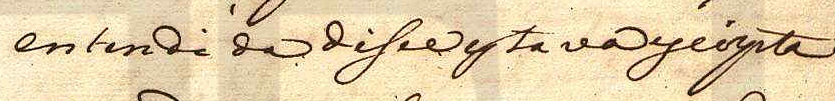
entendida disse estava escripta
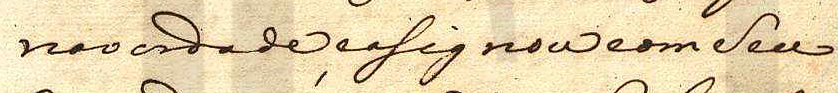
na verdade e asignou com Seu
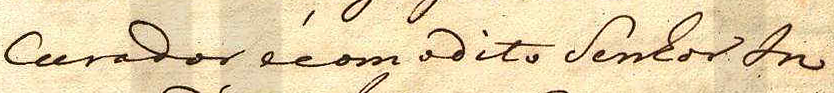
Curador, e com o dito Senhor In
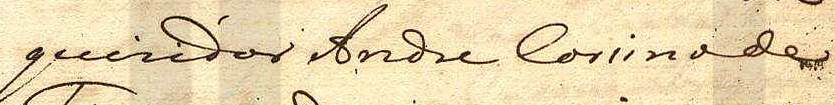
quizidor Andre Corsino de
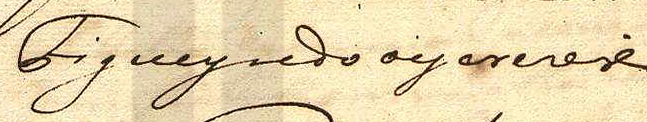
Figueyredo o escrevi
